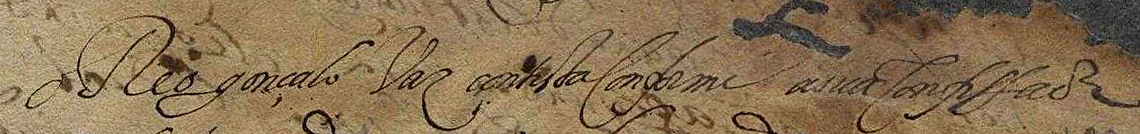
a Reo gonçalo Vaz contesta Conforme a sua Confissaõ
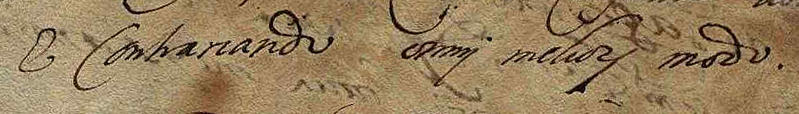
E Contrariando omnj melioris modo.
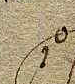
1o
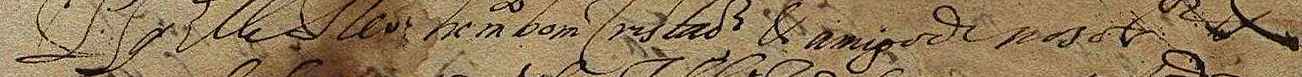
P. q̄ Elle Reo he mto bom Cristaõ & amigo de noso Sor &
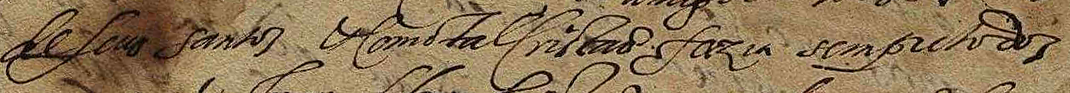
de seus santos & como tal Cristaõ fazia sempre todos
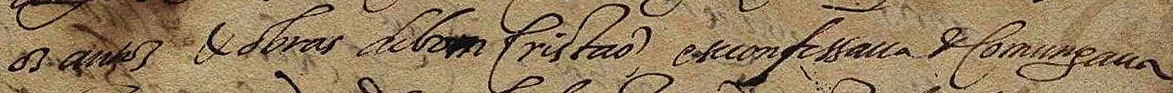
os autos & obras de bom Cristaõ se confessaua & Comungaua
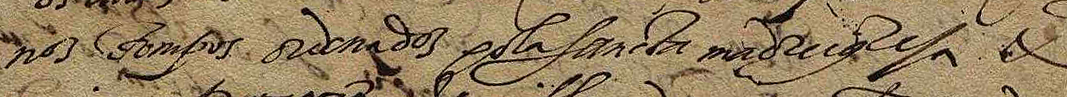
nos tempos ordenados pola Sancta madre igreja &
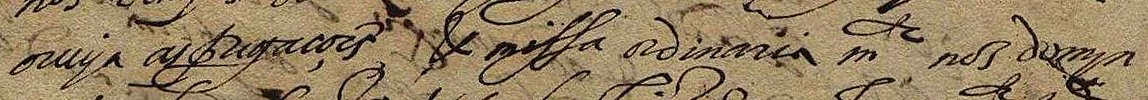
ouuja as pregaçoīs & missa ordinariamte nos domjn
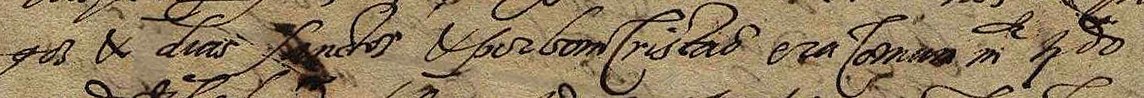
gos & dias sanctos & por bom Cristaõ era Comummte tjdo
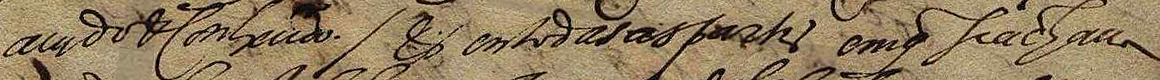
auido & Conhecido./ & em todas as partes em q̄ se achaua
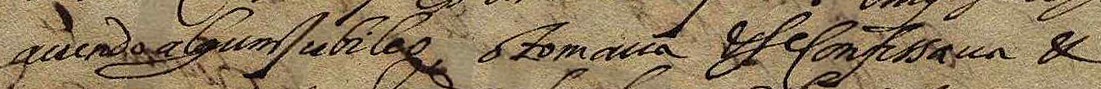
auendo algum Jubileo, o tomaua & se Confessaua &
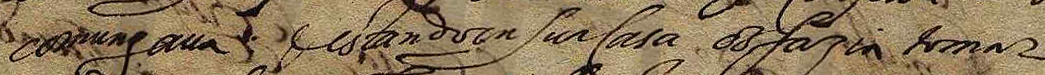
comungaua & estando em sua casa os fazia tomar
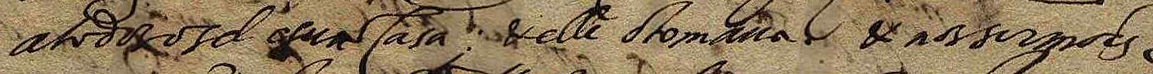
a todos os de sua Casa; & elle o tomaua. & aos sermões
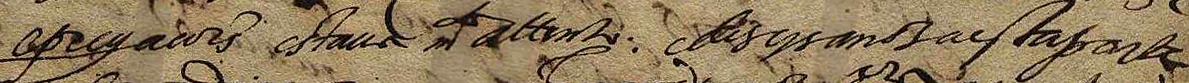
e pregaoes̄ estaua mto attento: e de seis anos a esta parte
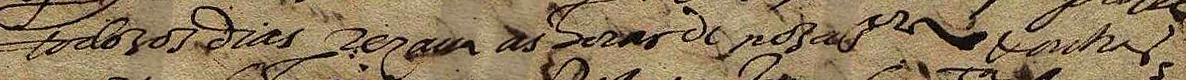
todos os dias rezaua as horas de nosa sra & outras
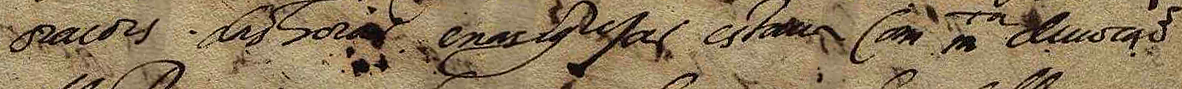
oracois das horas e nas igrejas estaua com mta deuocaõ
